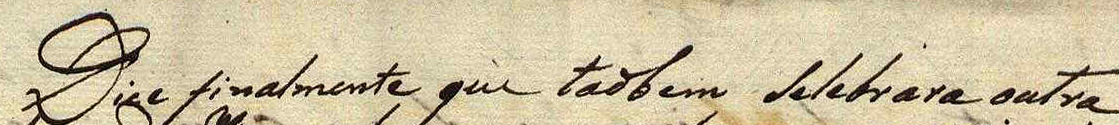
Dice finalmente que taõbem selebrara outra
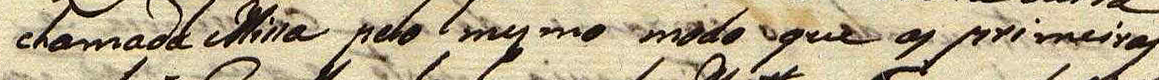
chamada Missa pelo mesmo modo que as primeiras
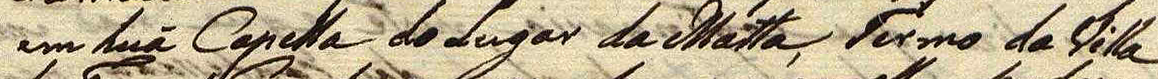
em huā Capella do Lugar da Matta, Termo da Villa
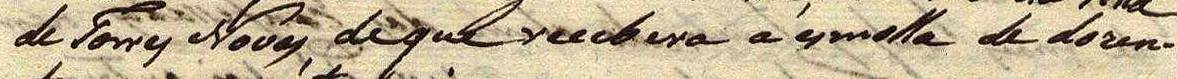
de Torres Novas, de que recebera a esmolla de dozen
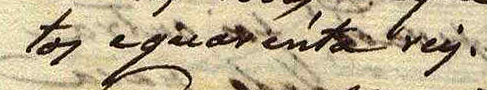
tos e quarenta reis.
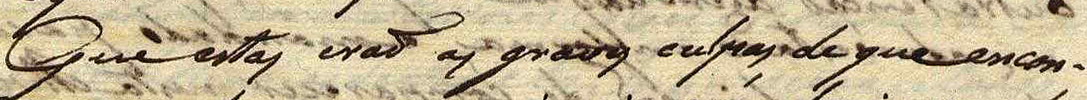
Que estas eraõ as graves culpas de que encon
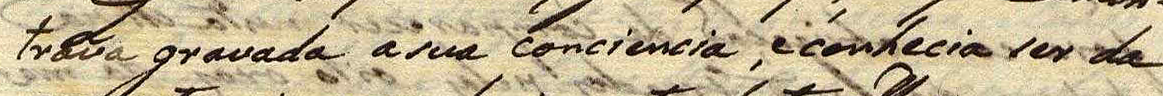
trava gravada a sua conciencia, e conhecia ser da
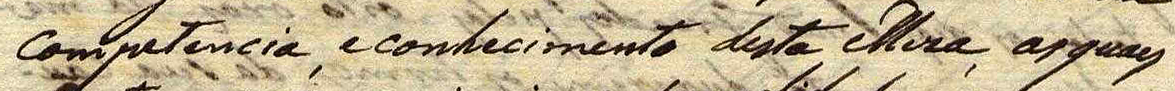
competencia, e conhecimento desta Meza, as quaes
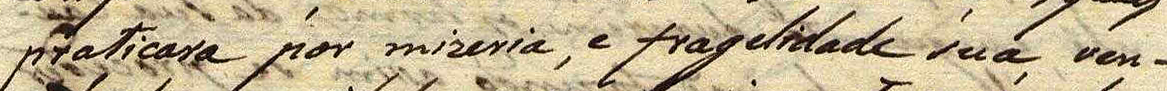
praticara por mizeria, e fragelidade sua ven
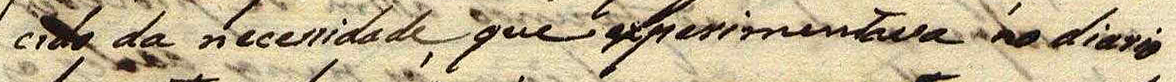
cido da necessidade, que experimentava no diario
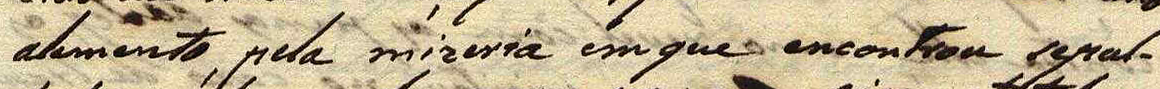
alemento, pela mizeria em que encontrou sepul
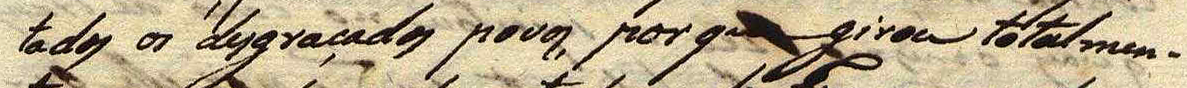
tados os desgraçados povos, porque girou totalmen
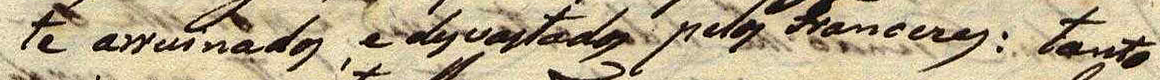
te arruinados, e desvastados pelos Francezes: tanto
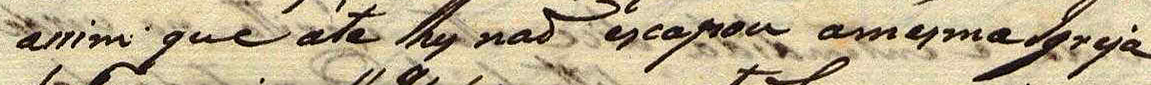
assim que ate lhes naõ escapou a mesma Igreja
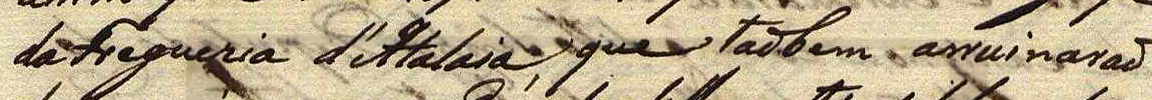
da Freguezia d'Atalaia, que taõbem arruinaraõ
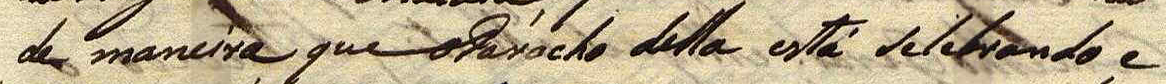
de maneira que o Parocho della está selebrando e
